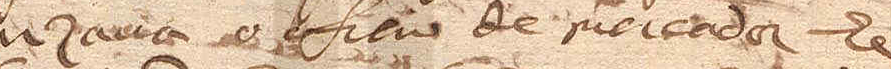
uzaua o oficio de mercador he
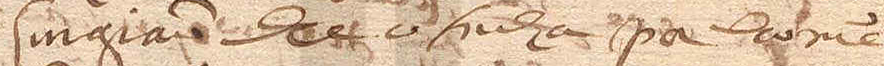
Surgiaõ he o tinha por homē
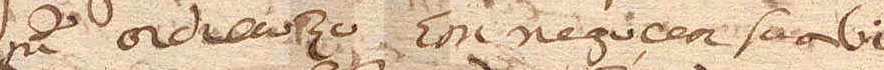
mto ardillozo Em negoçear sua vi
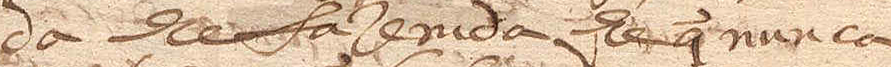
da he fazemda he q̄ nunca
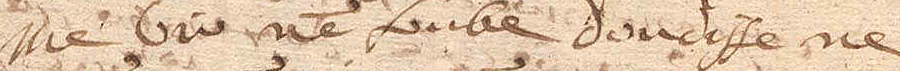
lhe vio nē soube doudisse ne
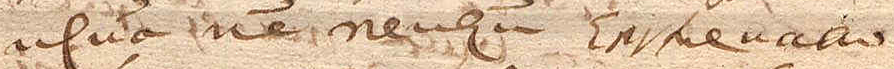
nhuā nē nenhū Emtreuallo
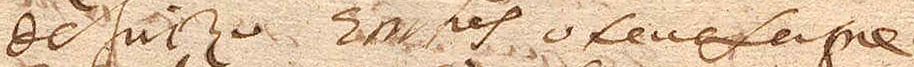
de Juizo E antes o teue senpre
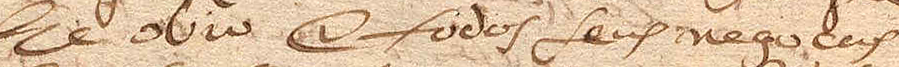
he ovio e todos seus negoçeos
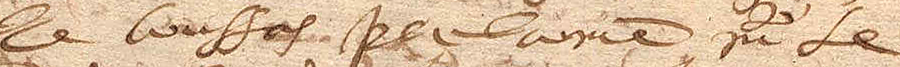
he coussas per homē mto se
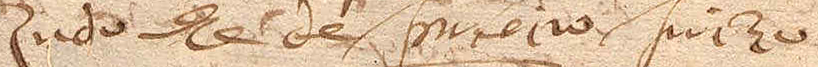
zudo he de Jmtejro Juizo
